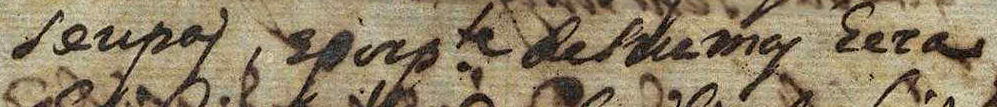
seu paj, E por p.te de sua maj hera
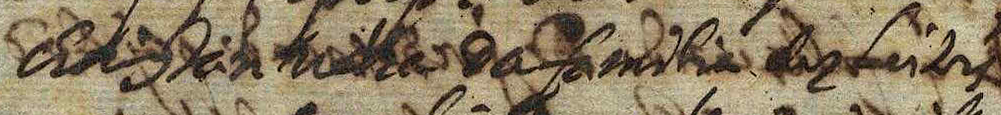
christan uelha da familia dos Leitoĩs
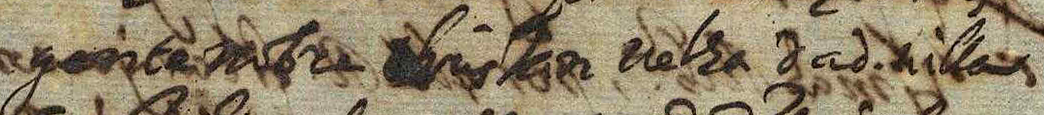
gente nobre christan uelha da d. uilla
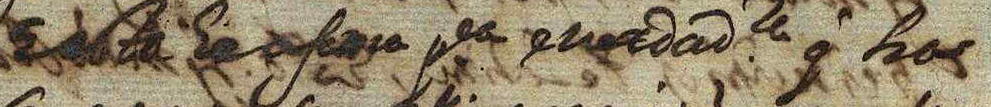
E esta he fama pca e uerdad.ra q̄ ha
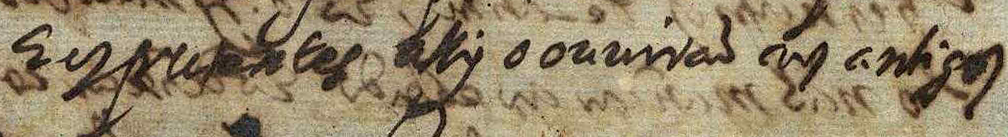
E os presentes assy o ouuiraõ aos antigos
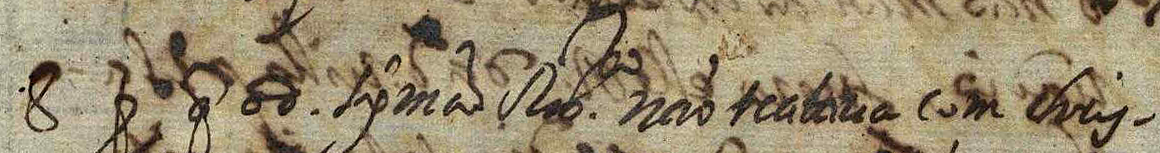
8 ꝓ q̄ o d. symaõ Rib.o naõ trataua com chris
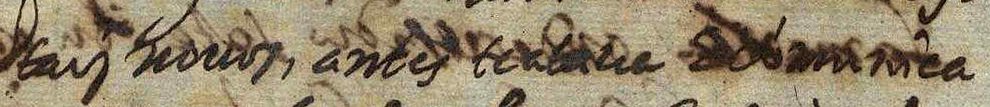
taos nouos, antes trataua E cōmunica
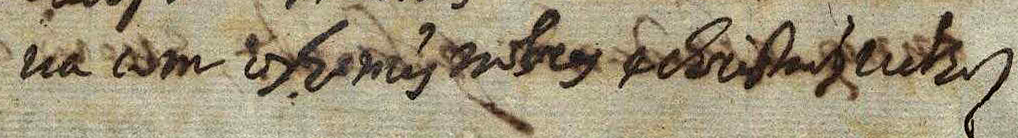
ua com os homēs nobres e christaõs uelhos
